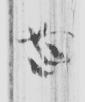必
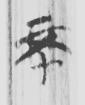不
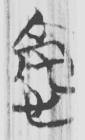{京心}
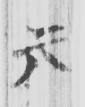亓
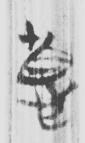惪
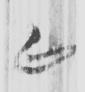㠯（以）
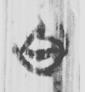自
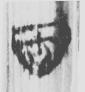固
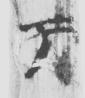于
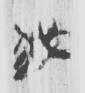我
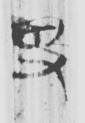卑
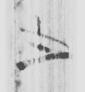之
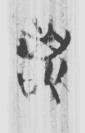若
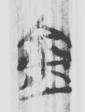金
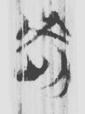刪
